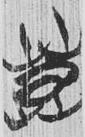莫
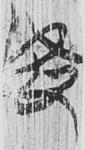奴（如）
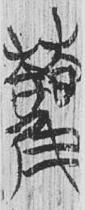雚
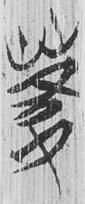葦
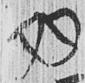多多
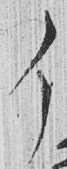人人
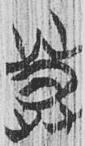莫
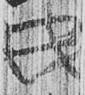奴（如）
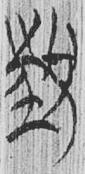○（兄）
